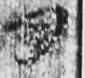月
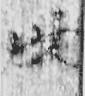戊
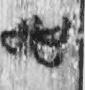申
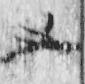之
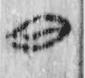日
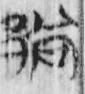○（尚）
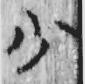少
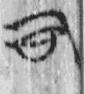司
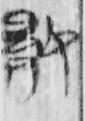敗
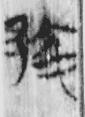○（蔡）
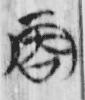丙
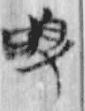受
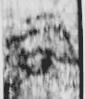○（期）
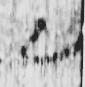乙
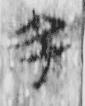丑
